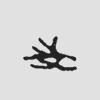徙
